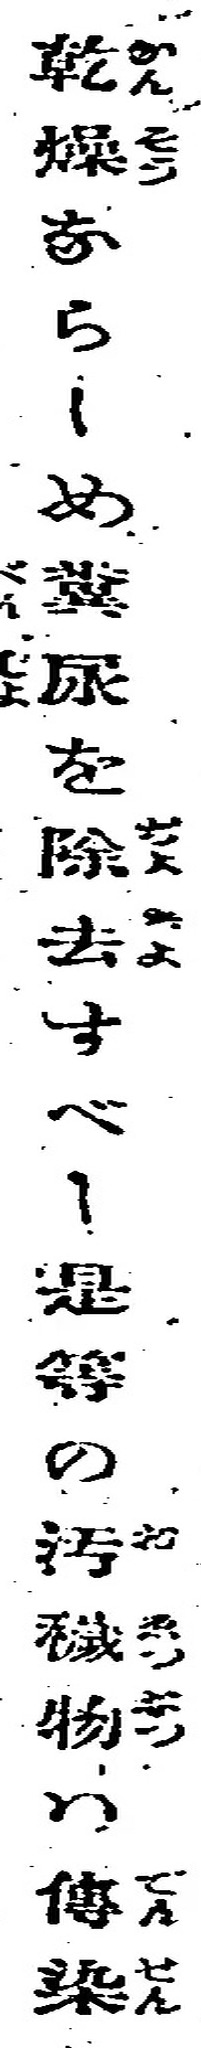乾燥ならしめ糞尿を除去すべし是等の汚穢物は伝染
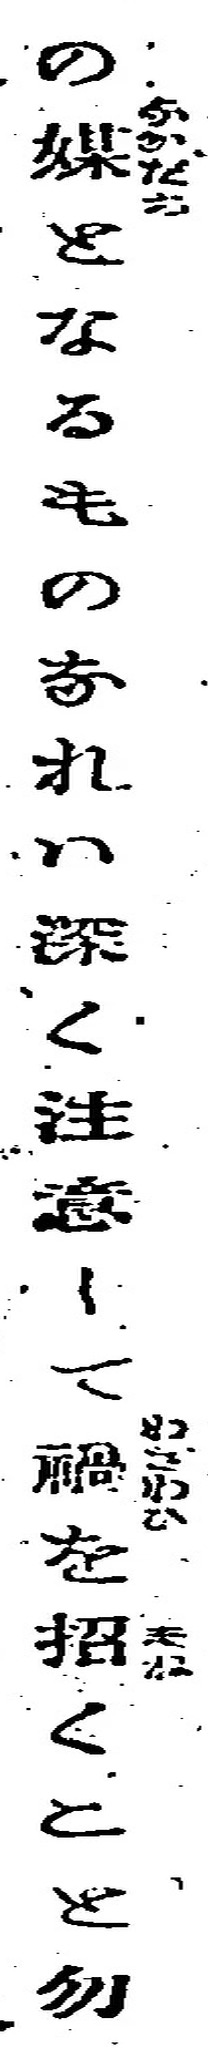の媒となるものなれは深く注意して禍を招くこと勿

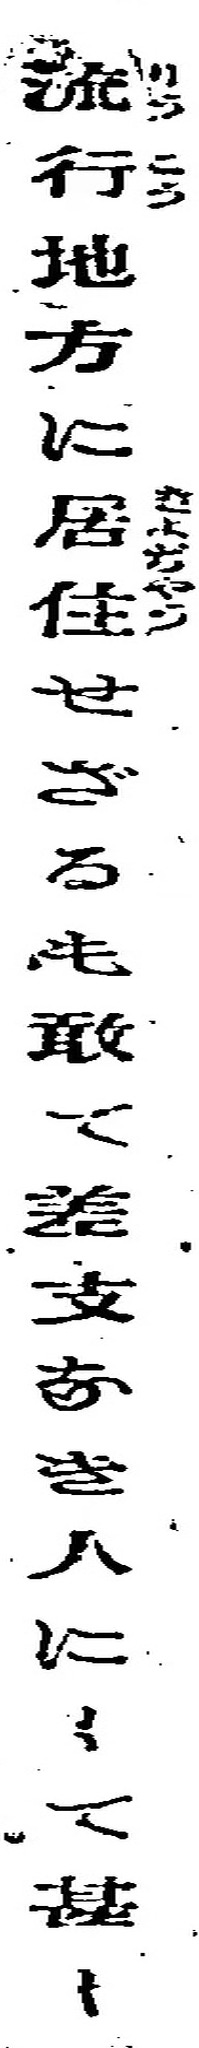流行地方に居住せざるも敢て差支なき人にして甚し
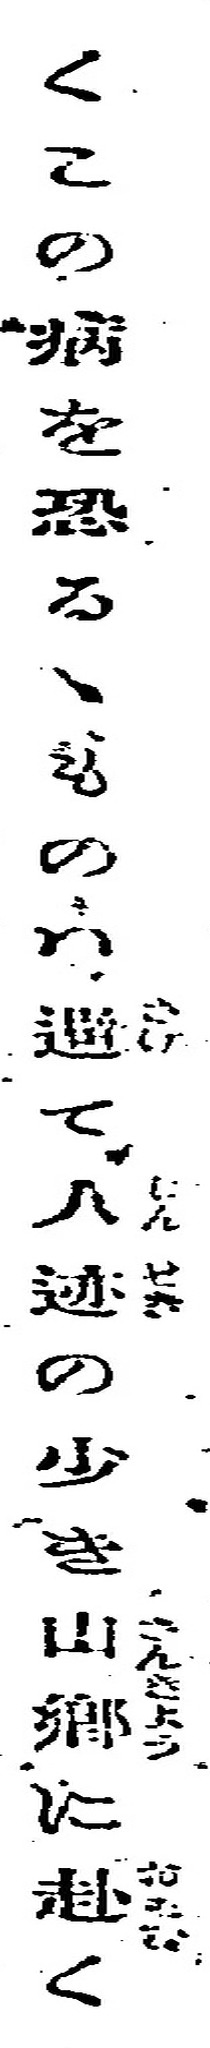くこの病を恐るゝものは避て人迹の少き山郷に赴く
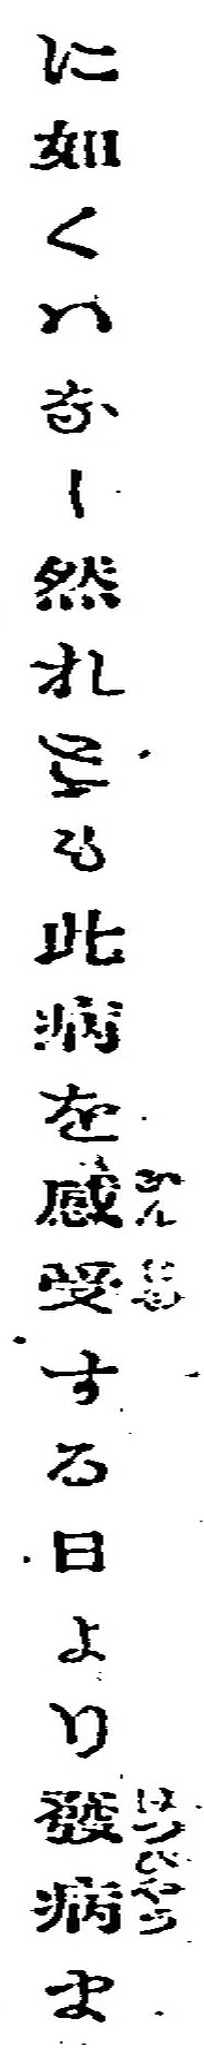に如くはなし然れとも此病を感受する日より発病ま
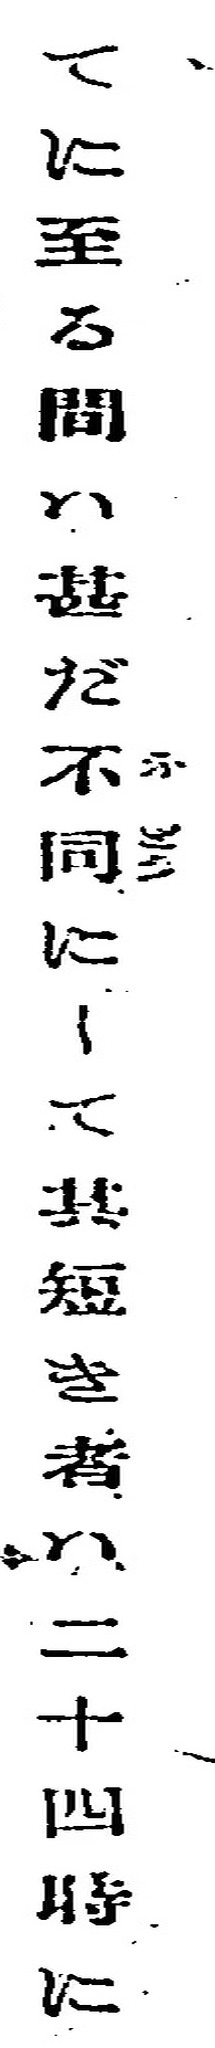てに至る間は甚だ不同にして其短き者は二十四時に
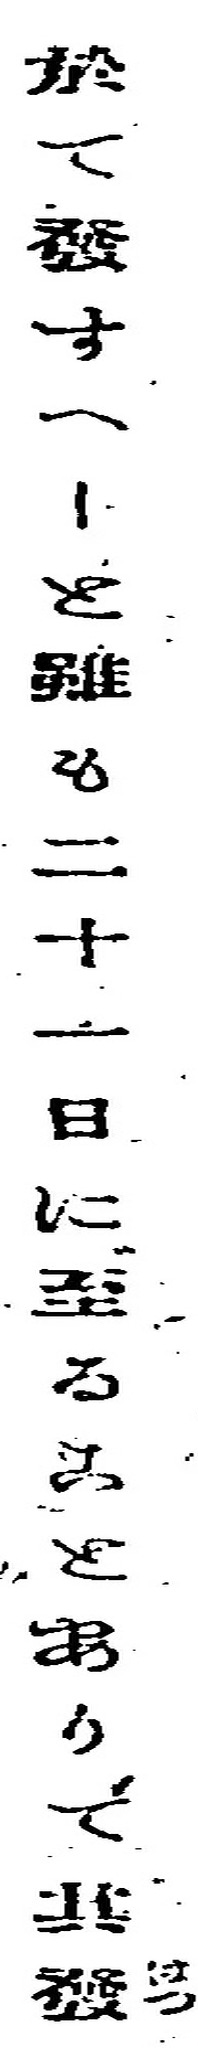於て発すへしと雖も二十一日に至ることありて其発
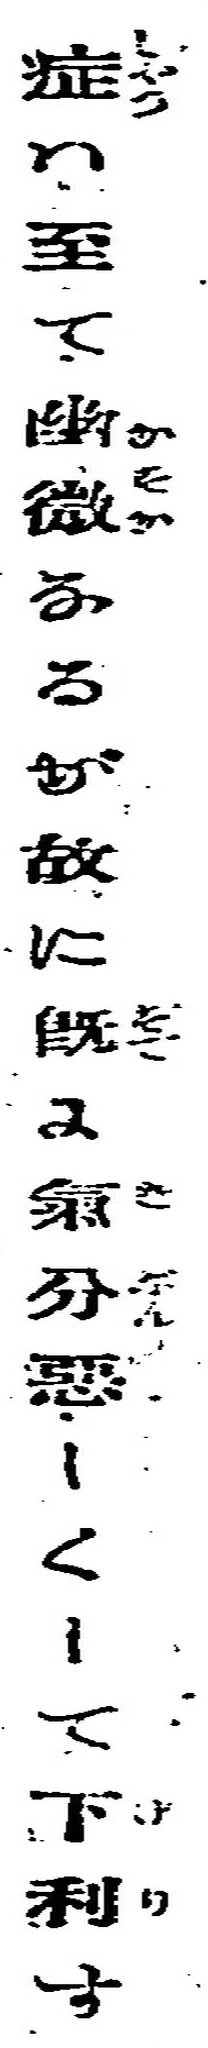症は至て幽微なるが故に既に気分悪しくして下利す
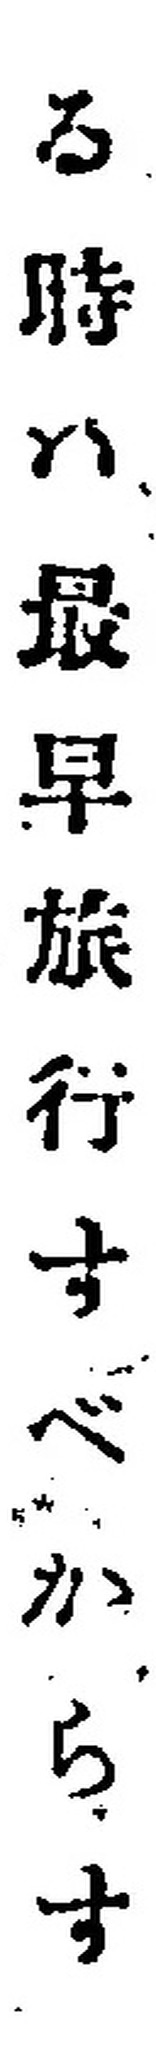る時は最早旅行すべからす
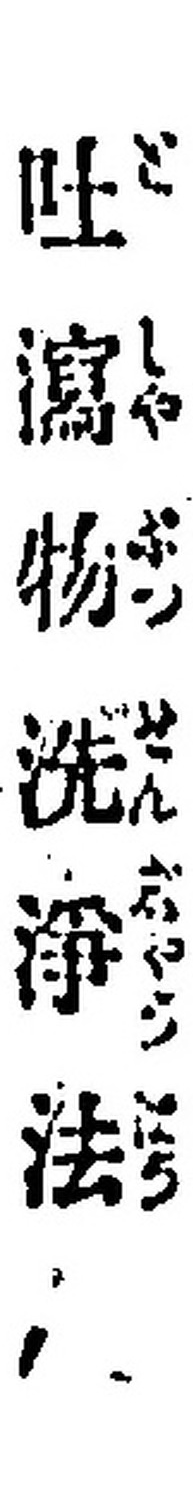吐瀉物洗浄法
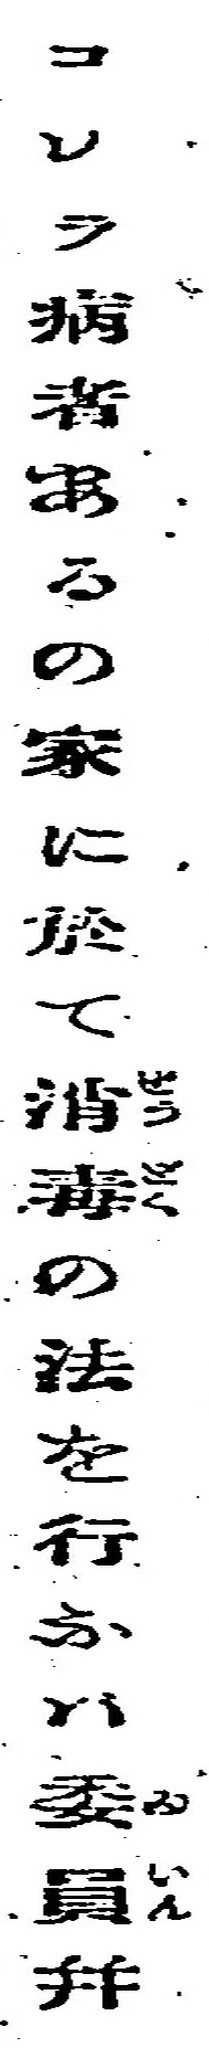コレラ病者あるの家に於て消毒の法を行ふは委員并
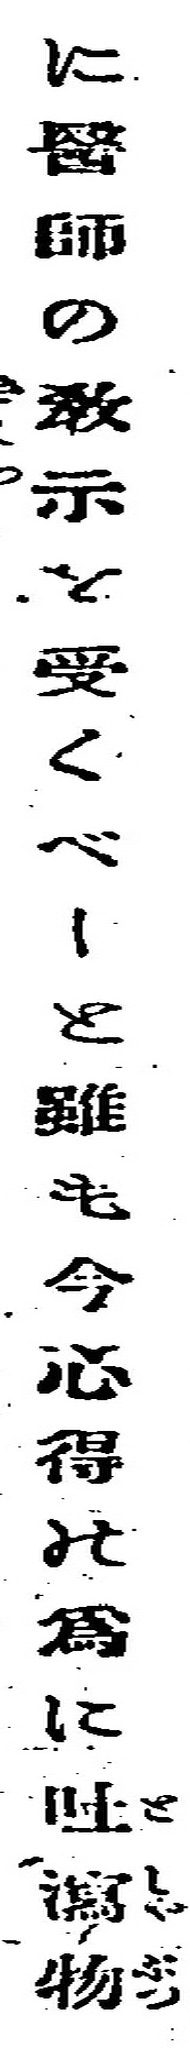に医師の教示を受くべしと雖も今心得の為に吐瀉物
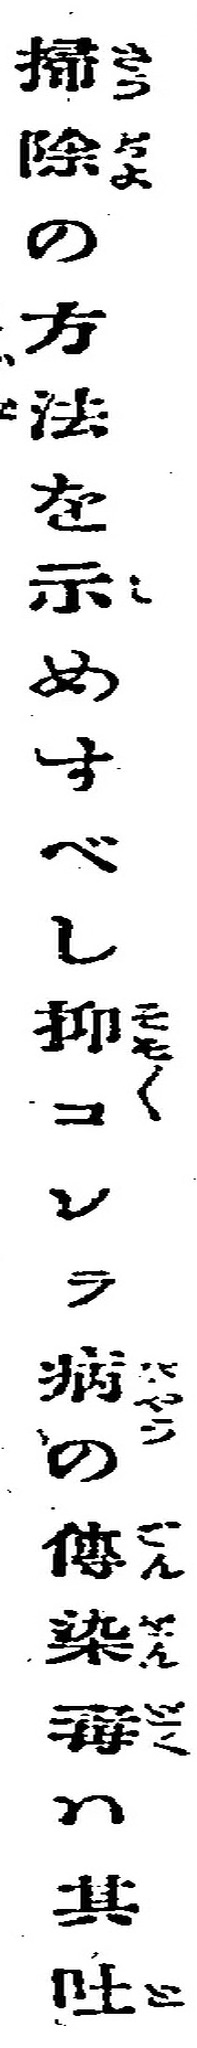掃除の方法を示めすべし抑コレラ病の伝染毒は其吐
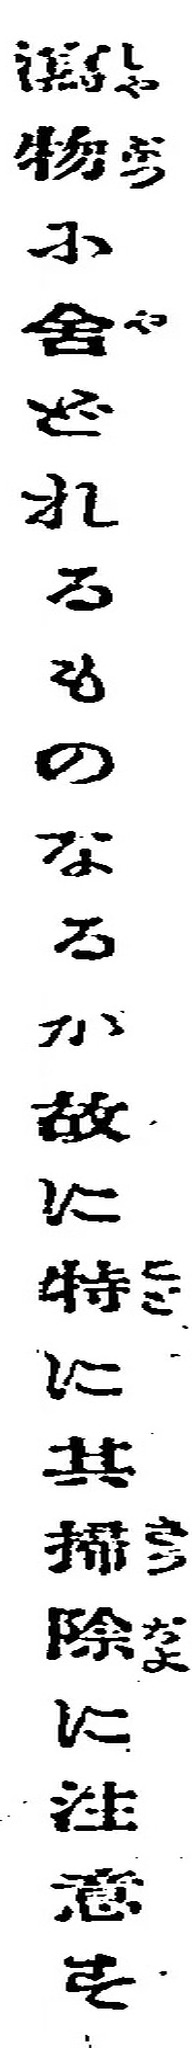瀉物に舎どれるものなるか故に特に其掃除に注意す
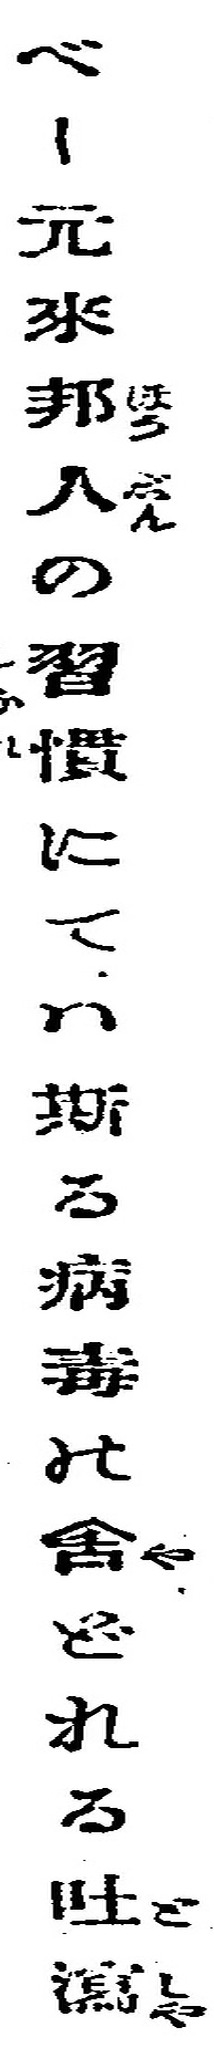べし元来邦人の習慣にては斯る病毒の舎どれる吐瀉
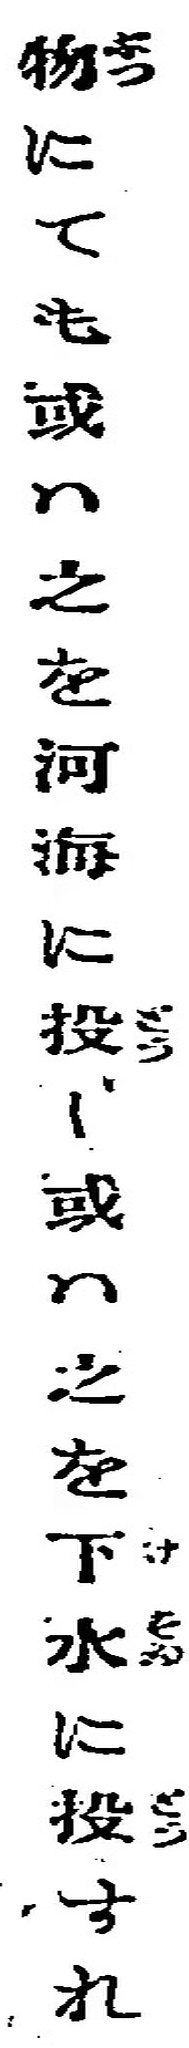物にても或は之を河海に投し或は之を下水に投すれ
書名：これら病予防心得
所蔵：国立国会図書館 National Diet Library, JAPAN
